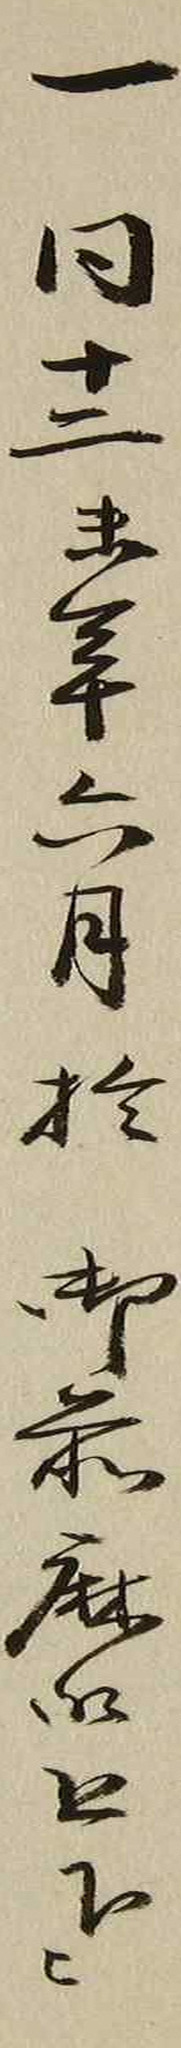一同十二未年六月於御前麻御上下被
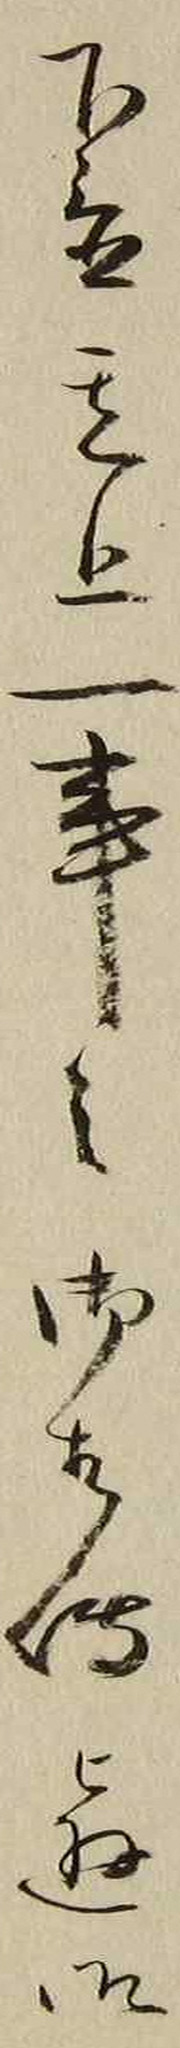下置其上一事之御相伝被返御
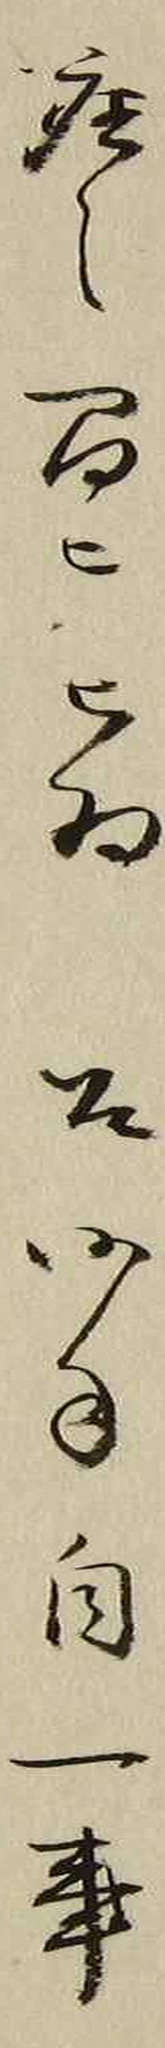座之間被被為召御手自一事
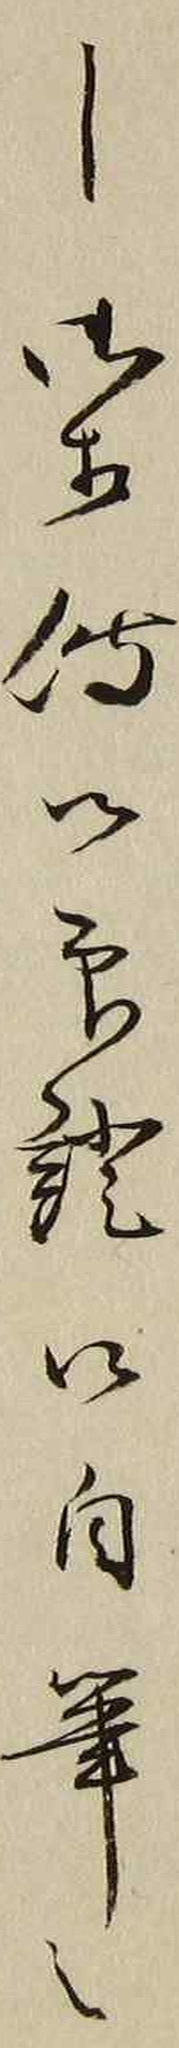之御相伝御印証御自筆之
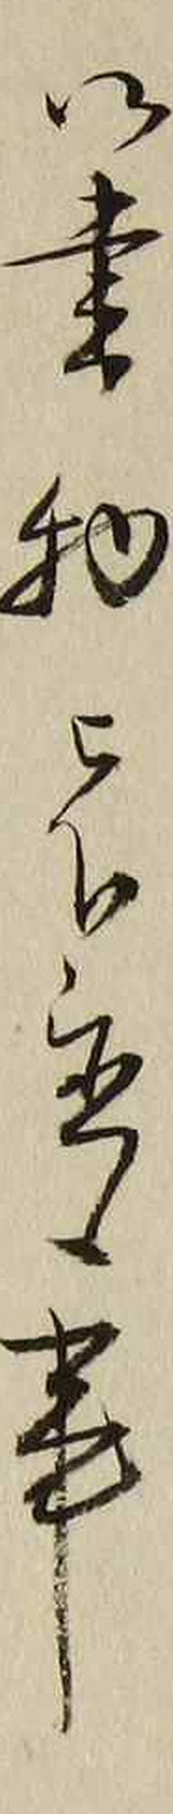御書物被下置候事
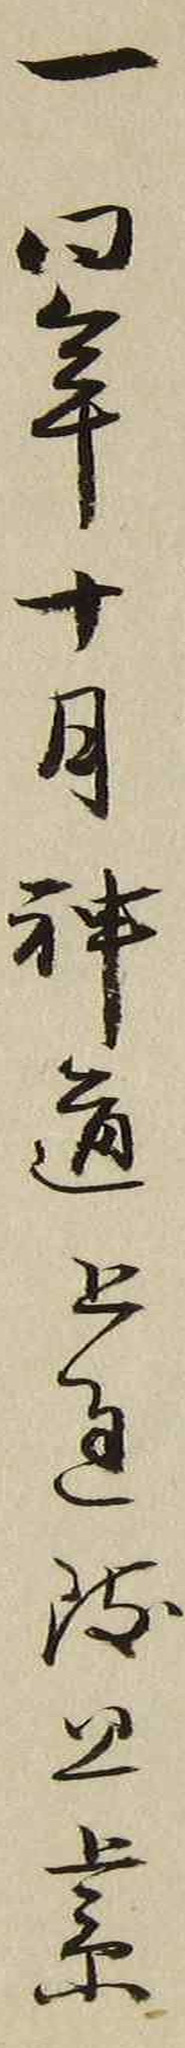一同年十月神道上達致且上京
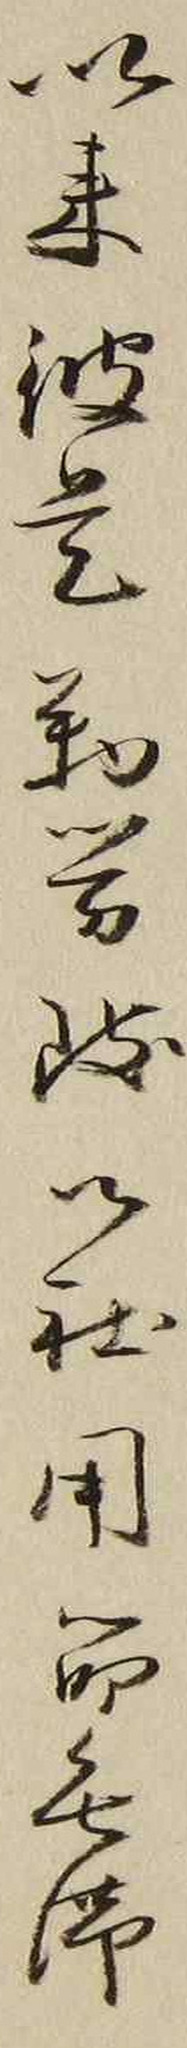以来彼是勤労致御社用筋無滞
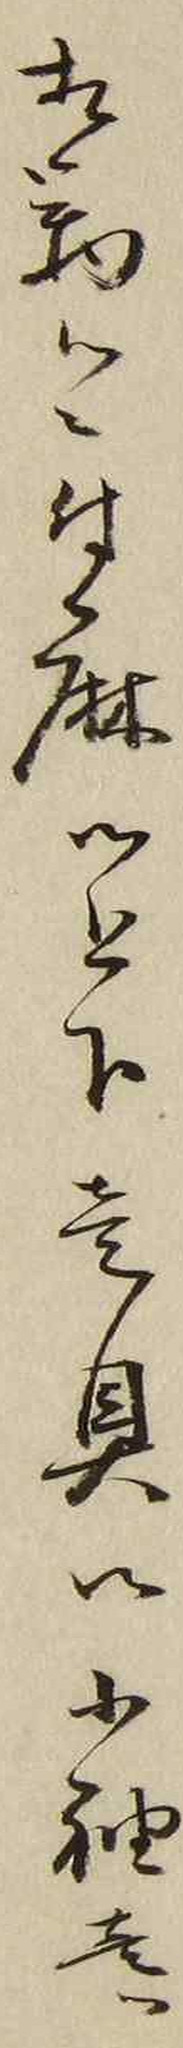相勤候ニ付麻御上下壱具御小袖壱ツ

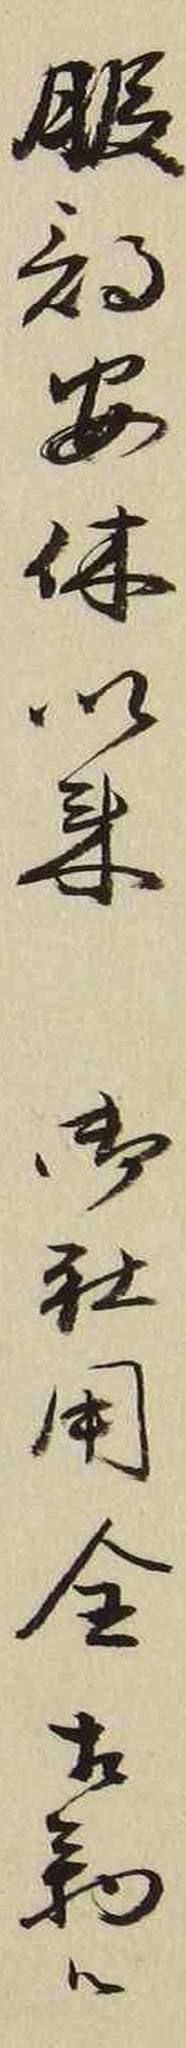服部安休以来御社用全相勤候
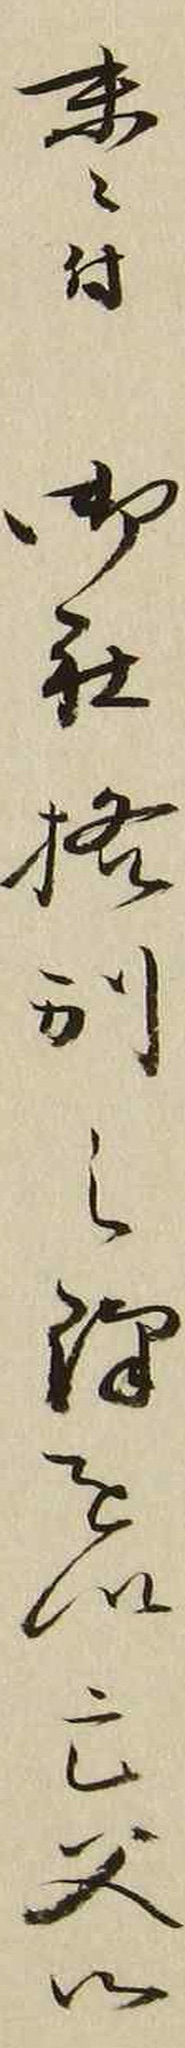末ニ付御社格別之訳を以亡父御
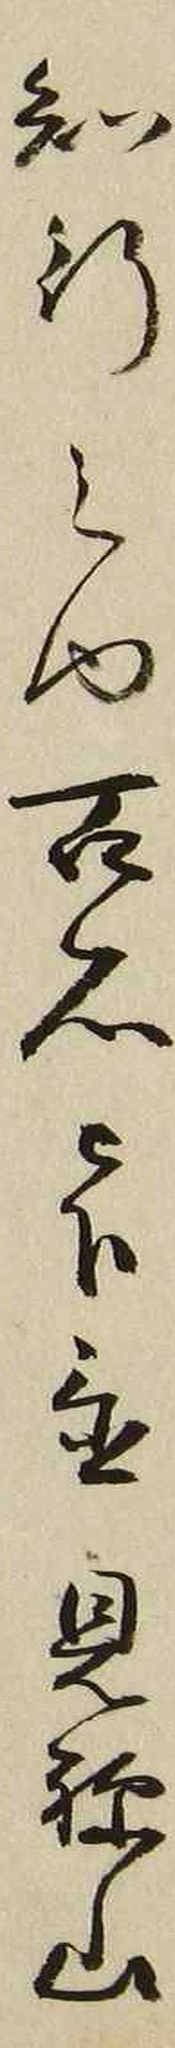知行之内百石被下置見祢山
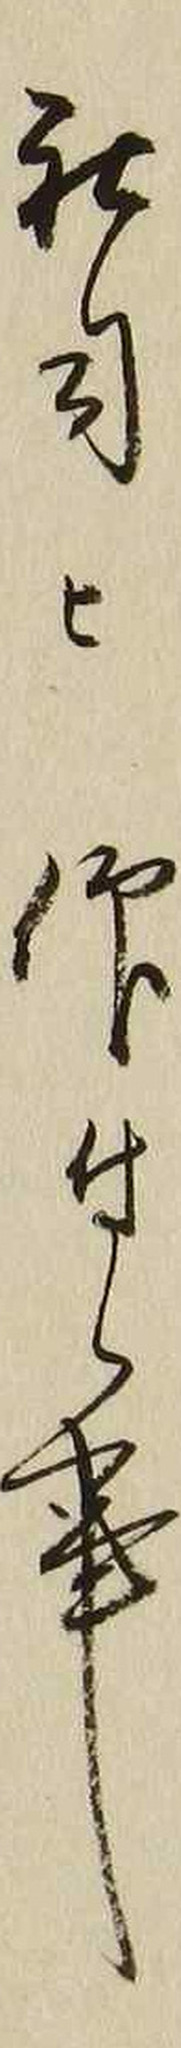社司被仰付候事
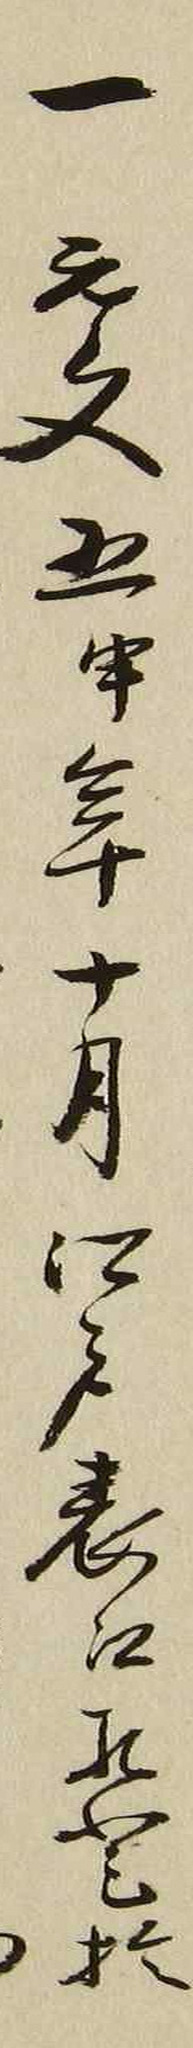一元文五申年十月江戸表江罷登於
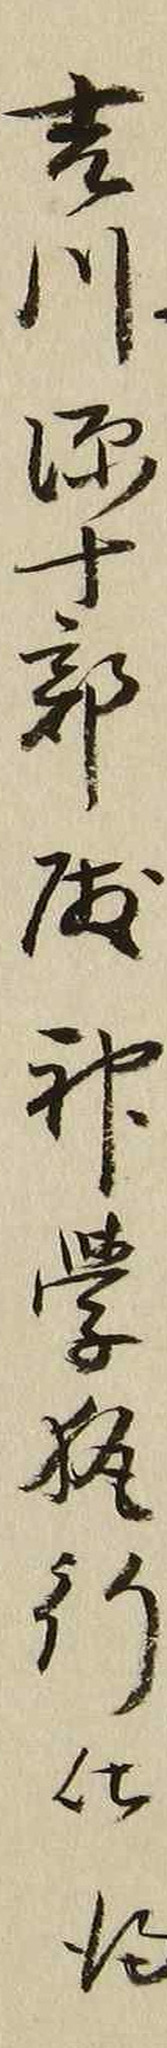吉川源十郎殿神学執行仕得
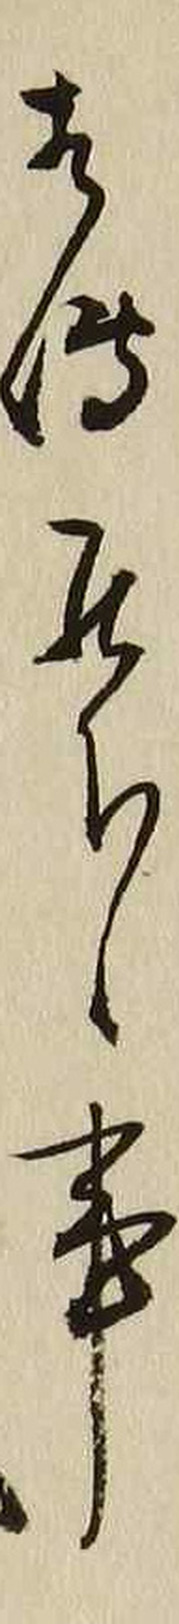相伝罷下候事
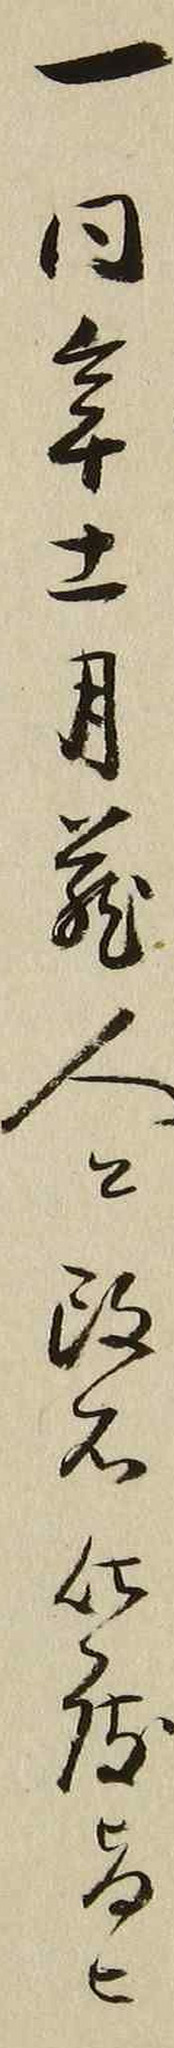一同年十一月蔵人と改名仕度旨被
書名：諸士系譜　巻之291　さ之部23
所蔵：会津若松市立会津図書館
